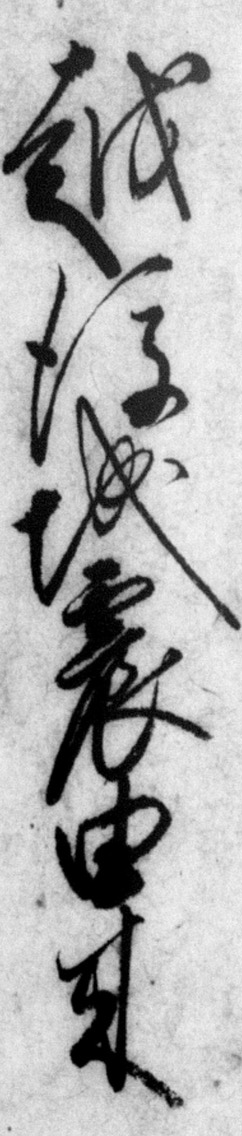越後地震由来

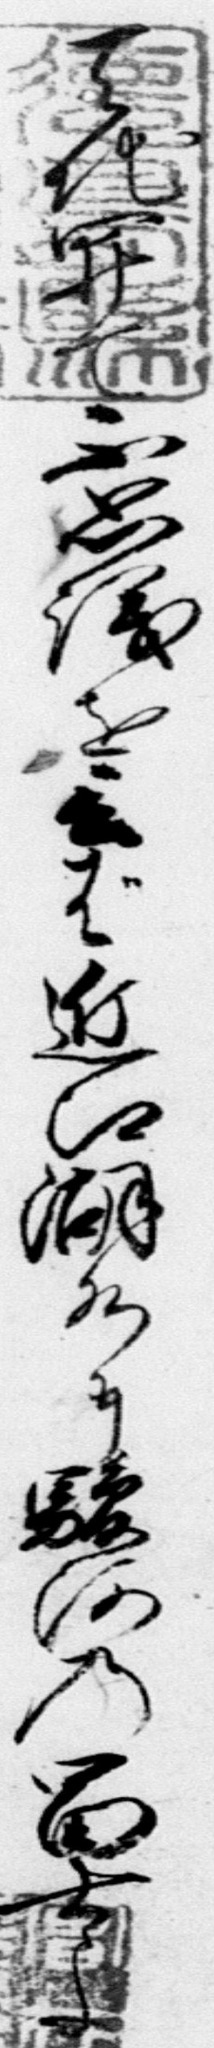天地開て不思議を言ば近江湖水に駿河の富士よ
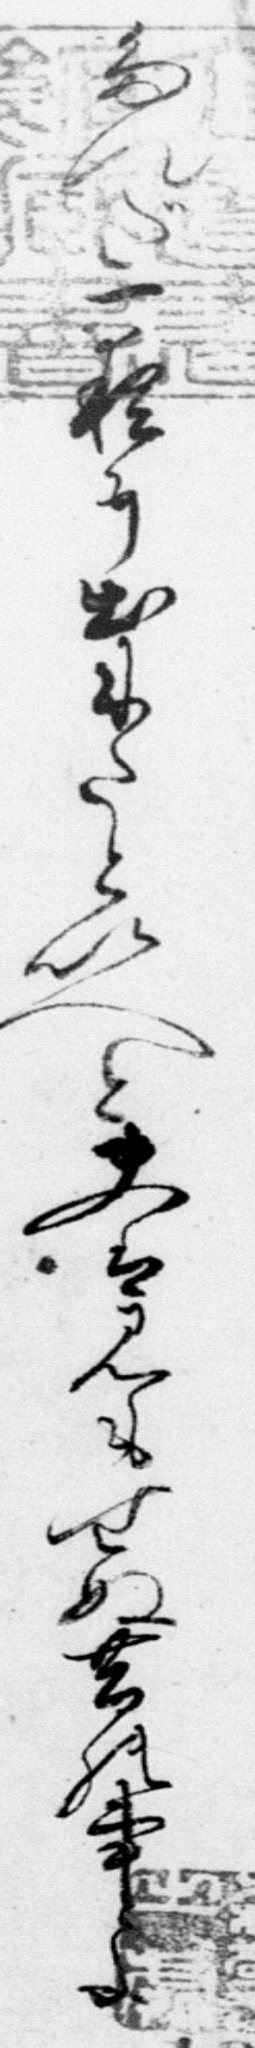たんだ一夜に出来たといへと夫は見もせぬ昔の事よ
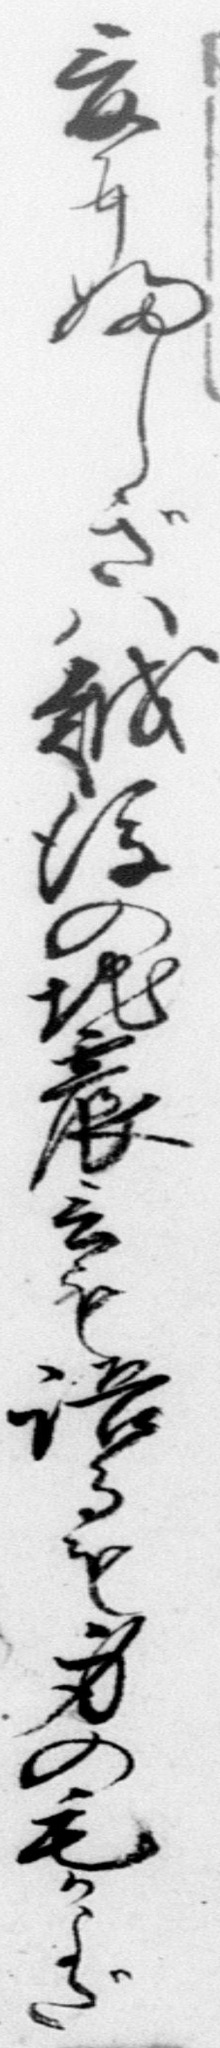爰にふしぎは越後の地震言も語るも身の毛かよだ
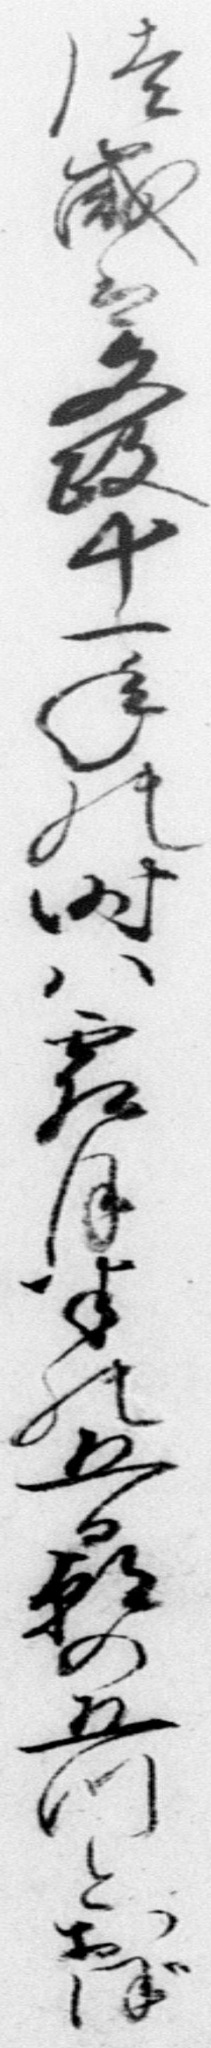つ歳は文政十一年の時は霜月半の五日朝の五ツとおぼ
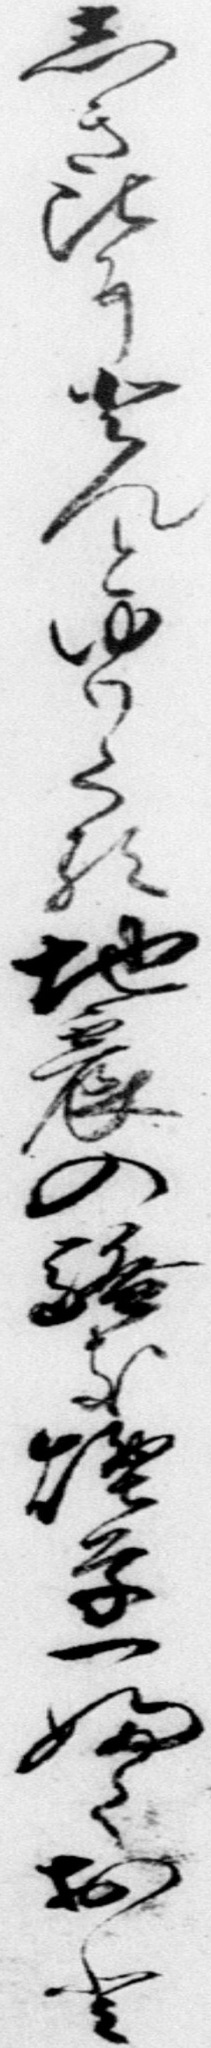しき頃にとんとゆりたる地震の騒き煙草一ふくおと
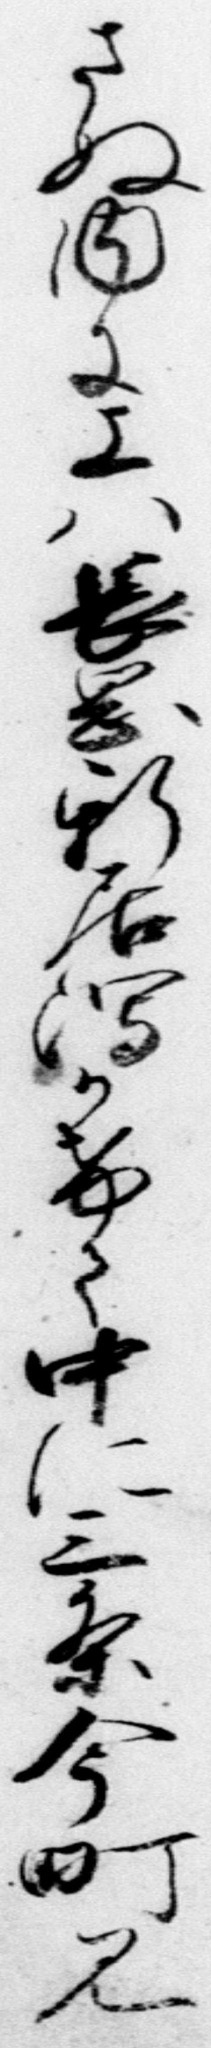さぬ内に上は長岡新居潟かけて中に三条今町見
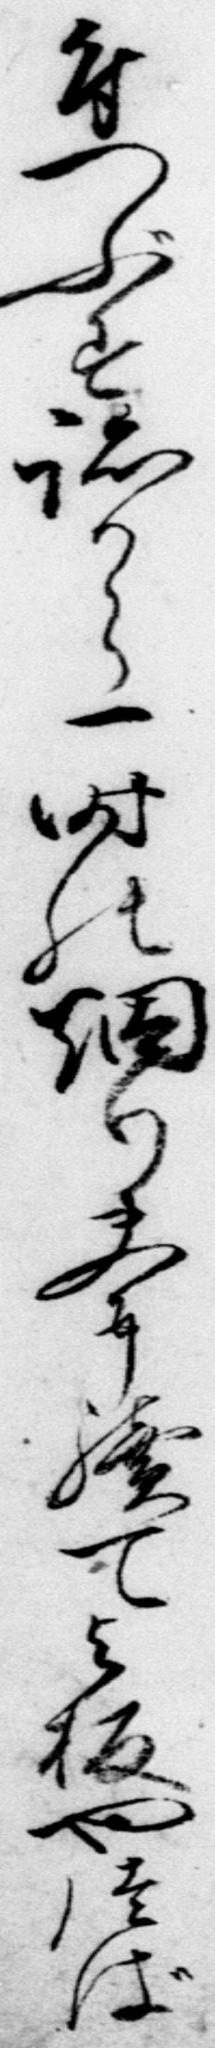付つぶす跡から一時の烟り夫に続て与板やつば

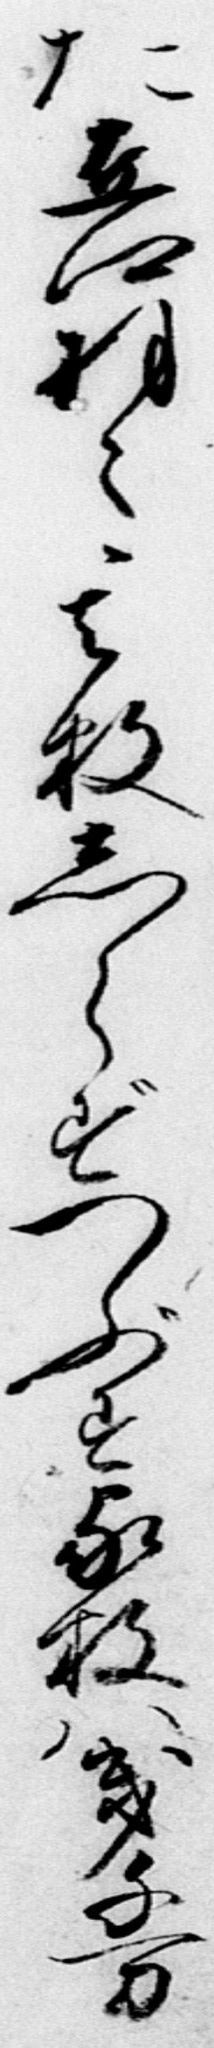た在郷村々其数しらずつぶす家数は幾千万
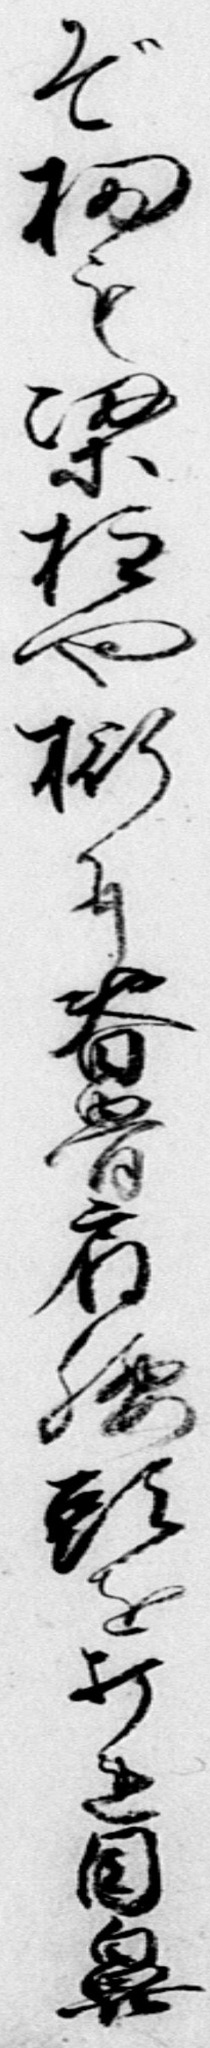ぞ扨も梁柱や桁に背骨肩腰頭を打れ目鼻
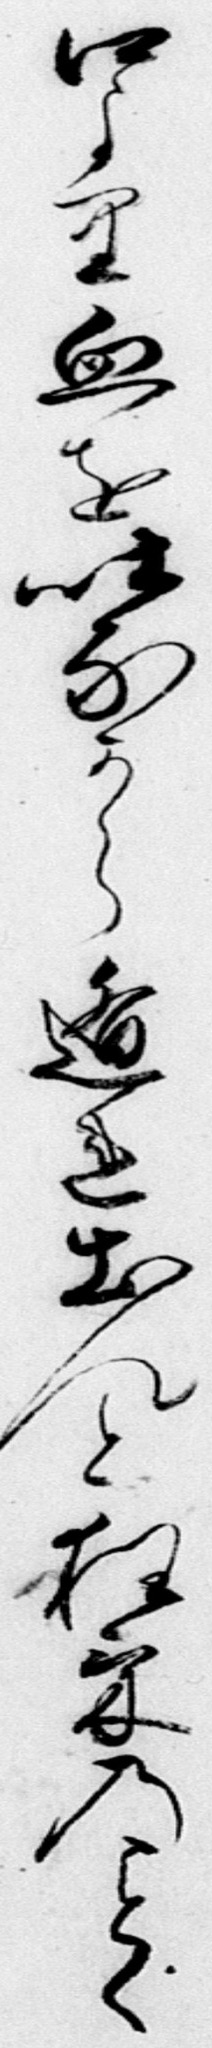口より血を吐なから遁れ出んと狂気のことく
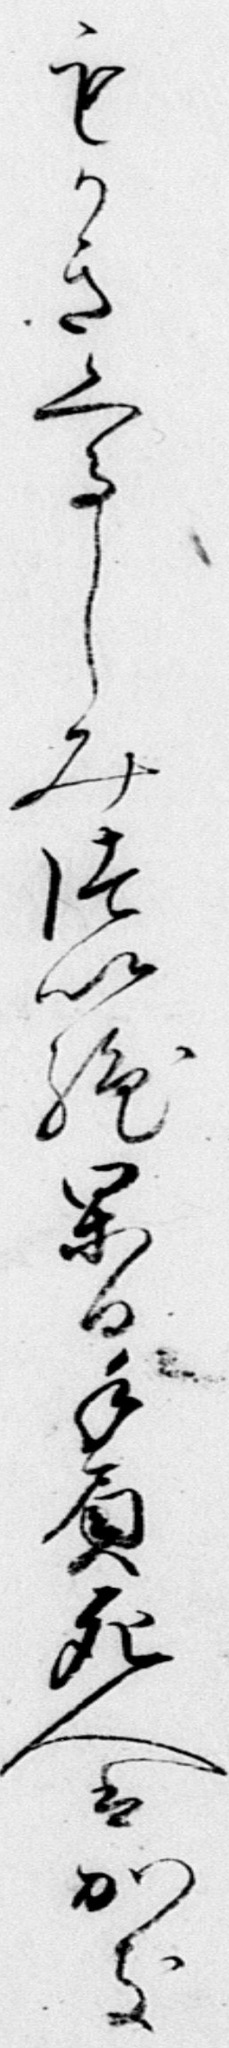もかきくるしみつい絶果る手負死人はかき
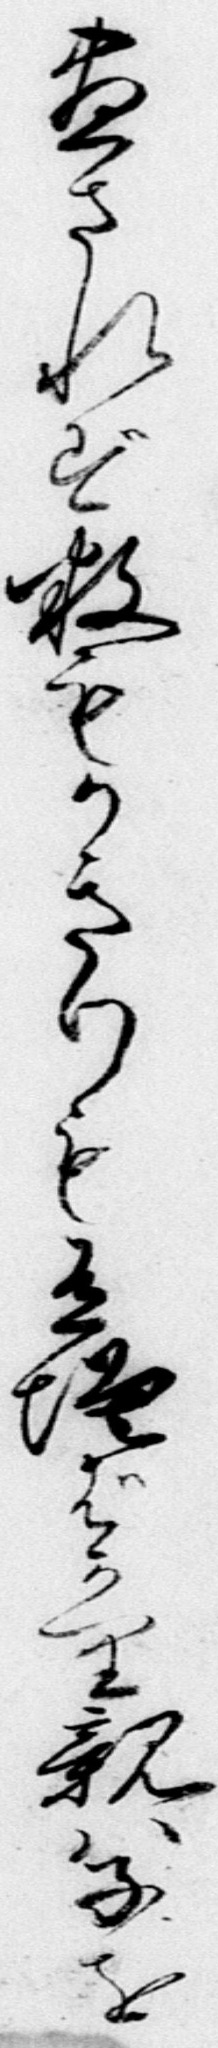尽されず数もかきりも有増ばかり親は子を
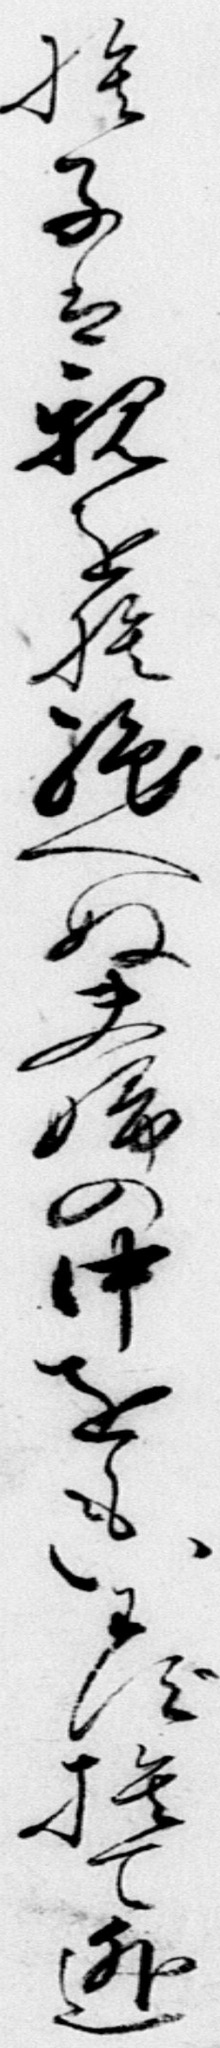捨子は親を捨絶へぬ夫婦の中をもいわず捨て逃
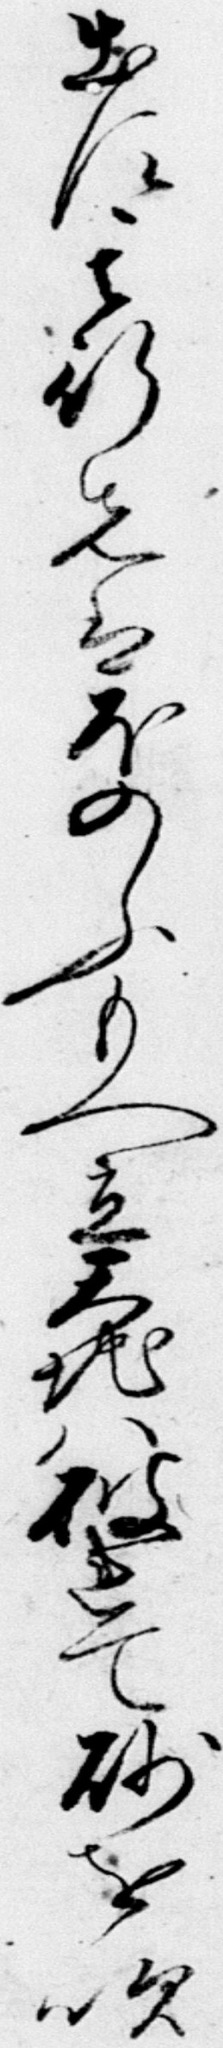出す其行先はほのふもへ立天地は破れて砂を吹
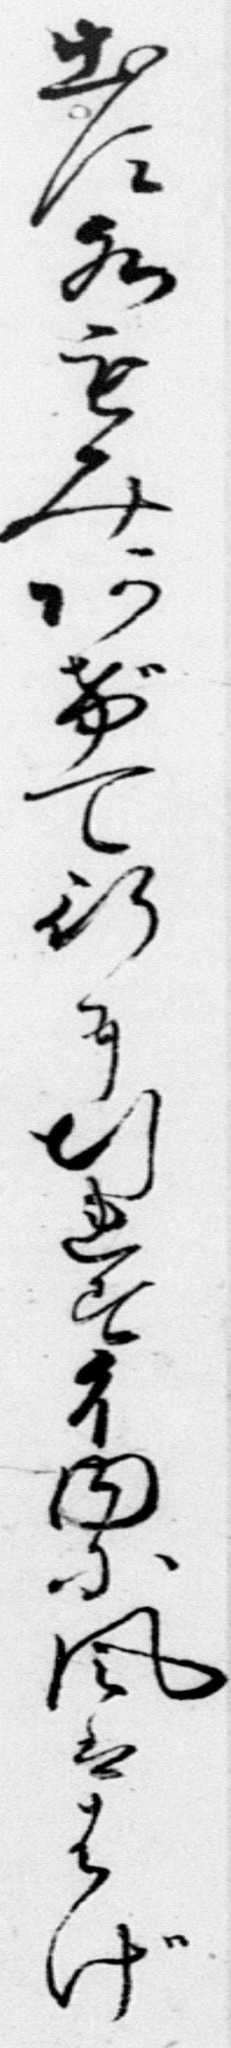出す水もみあげて行に行れす外内に風ははげ
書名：越後地震由来
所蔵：徳島県立図書館
